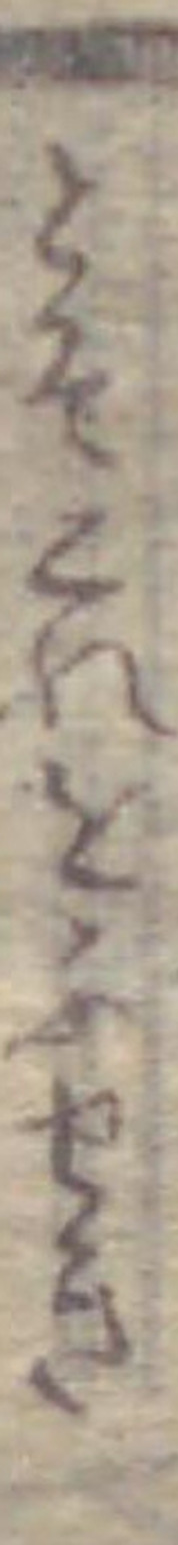とそこれをふせき
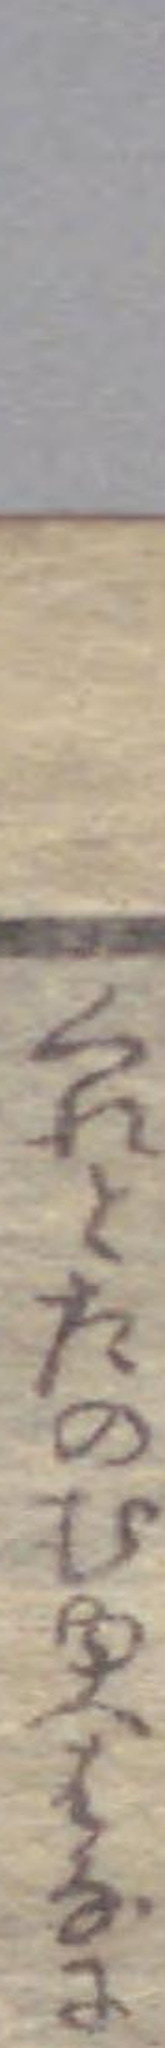くれとたのむゆへはなに
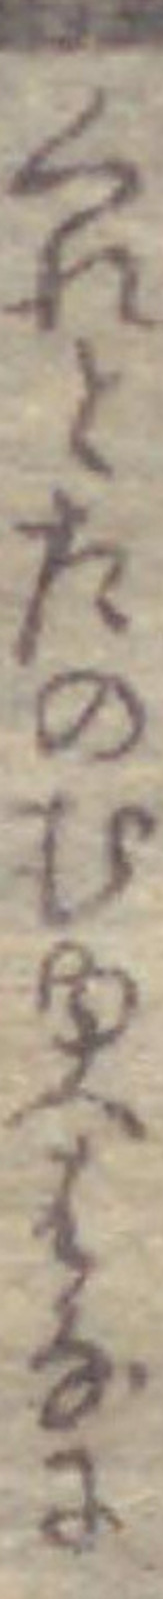くれとたのむゆへはなに
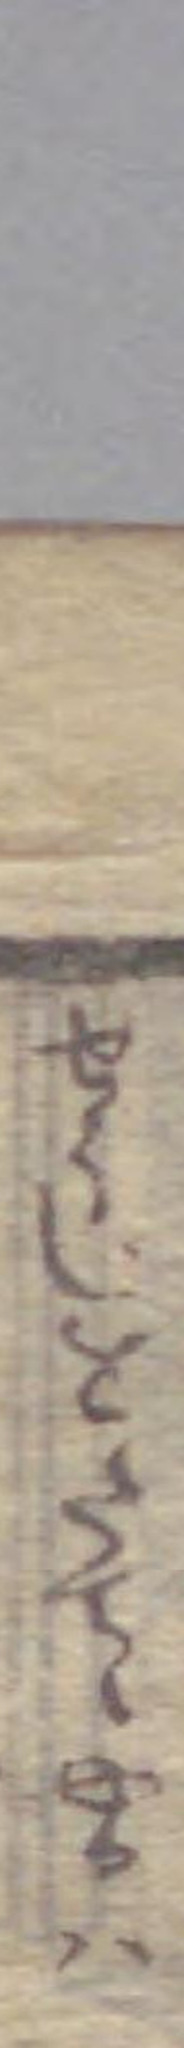せうしをたててやるは
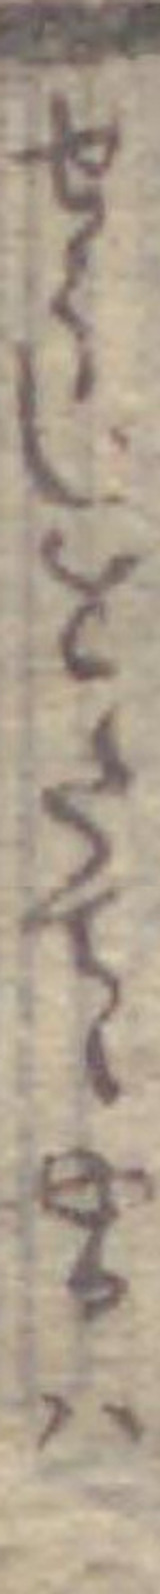せうしをたててやるは
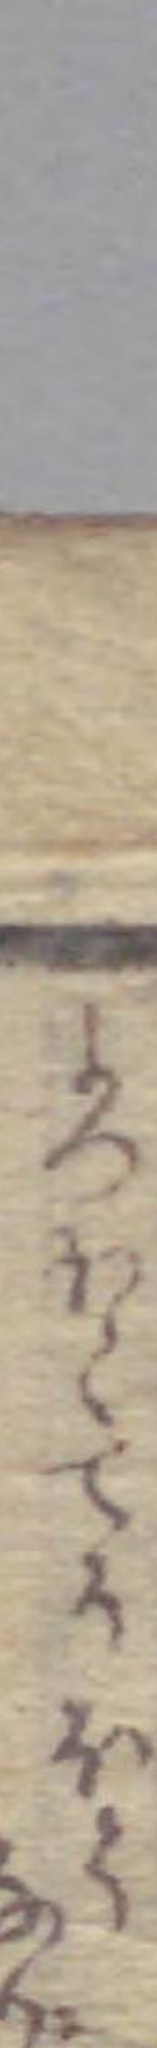よつほとてうほうなり
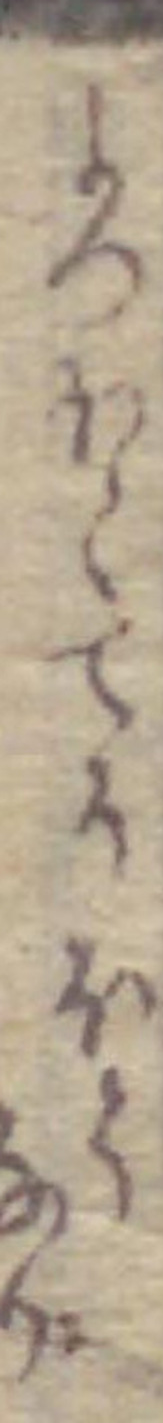よつほとてうほうなり

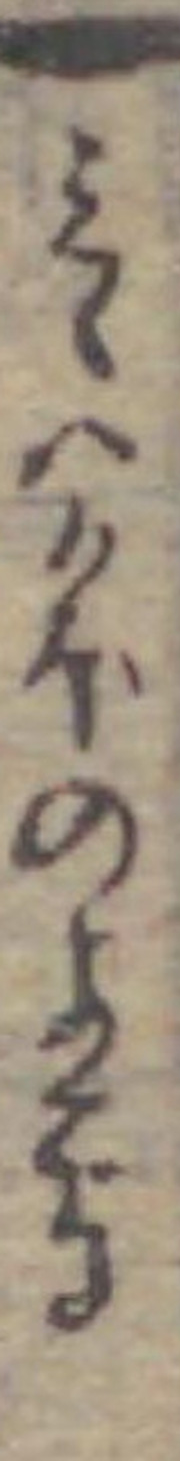みみはかほのよこに
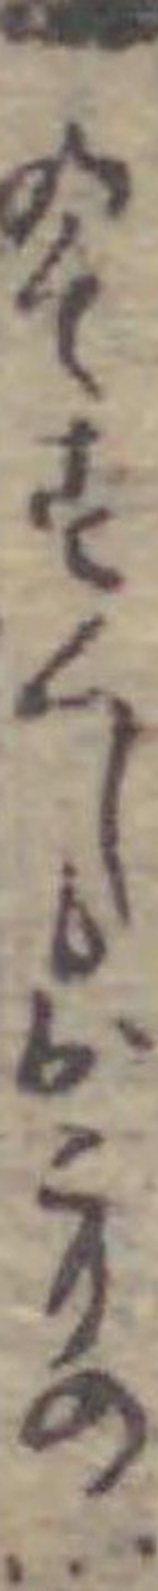ゐてすくしもおこりの
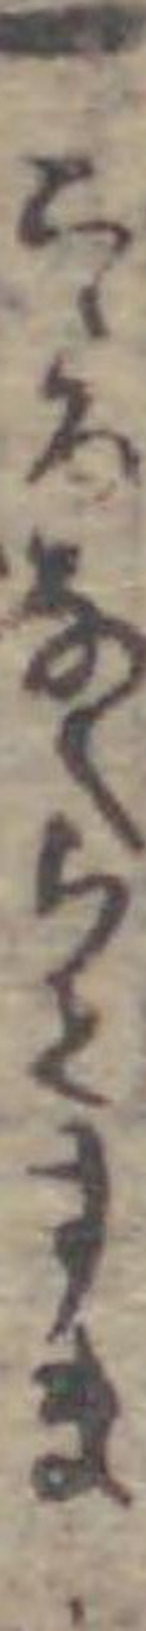こころなくちとすま
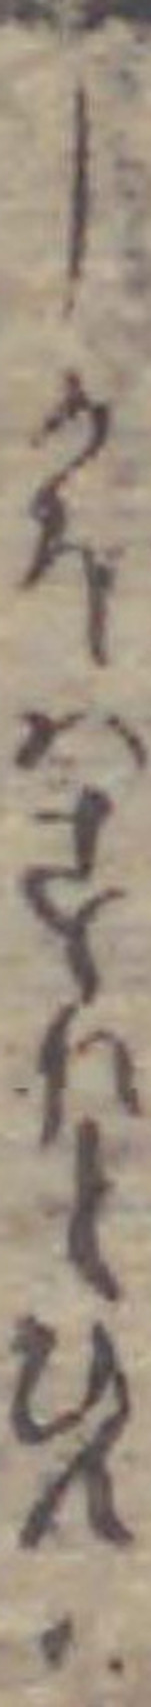しかほはすれとひん
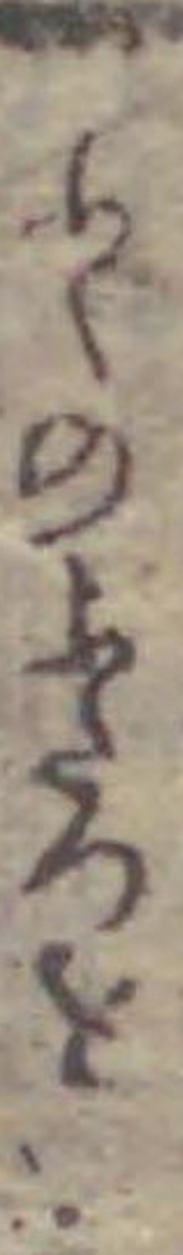ふくのふたつを
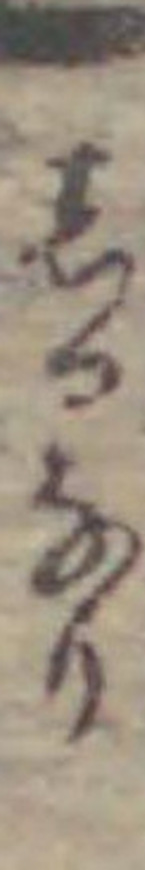しるなり
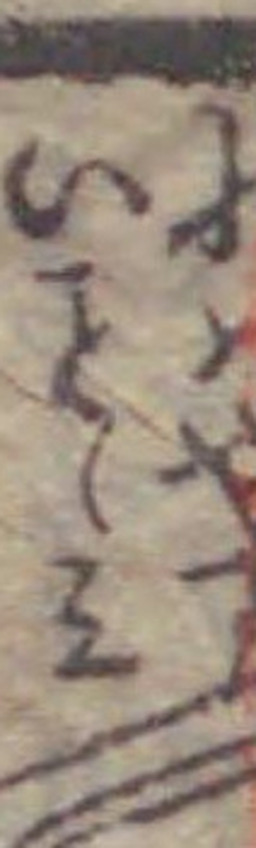いことのみ
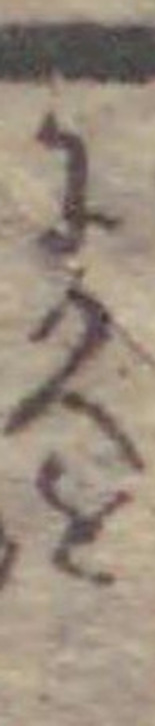にかへを
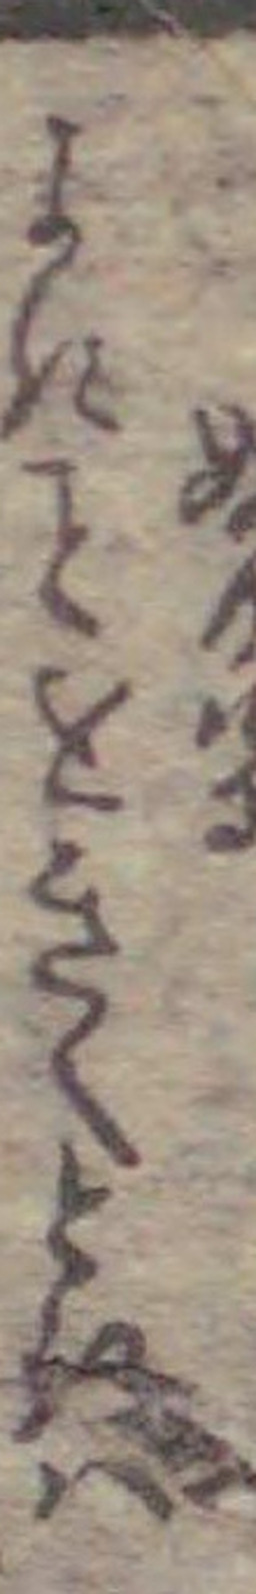よきことをきくときは
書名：五躰不具毒解薬 : 3巻
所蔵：国立国会図書館 National Diet Library, JAPAN
